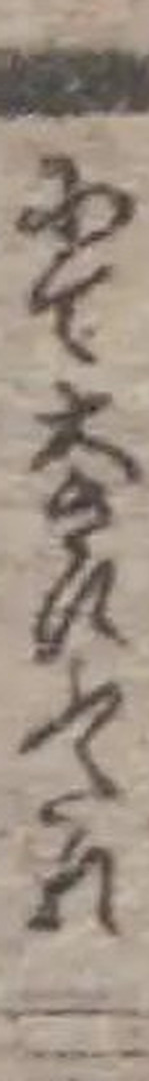にて大きにふたれ
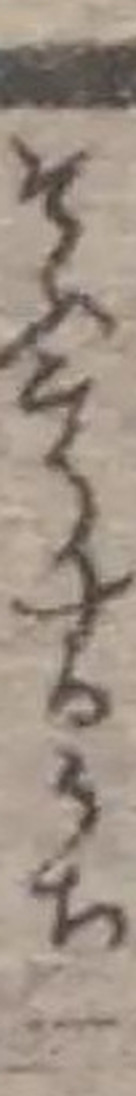そふこうするうち
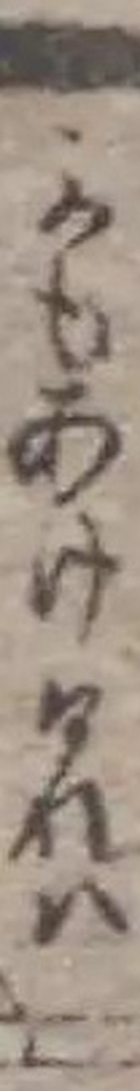よもあけけれは
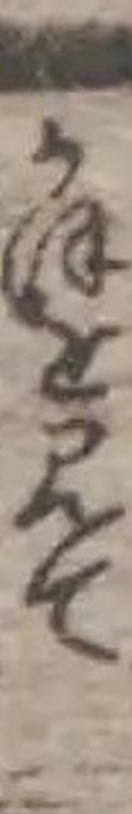かほを見て
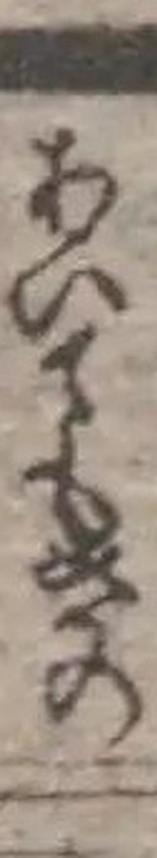あいてもきの
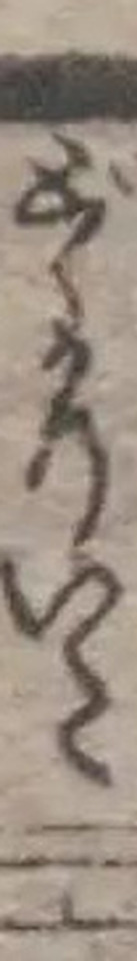どくかりいた
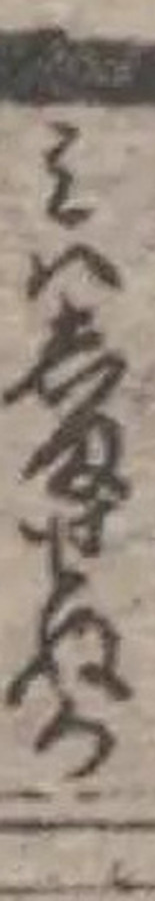みはしませぬか
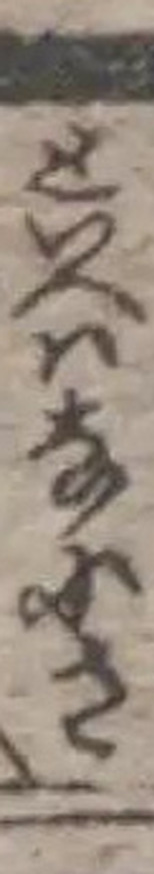といへはなにさ
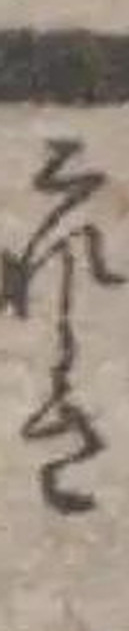これしき
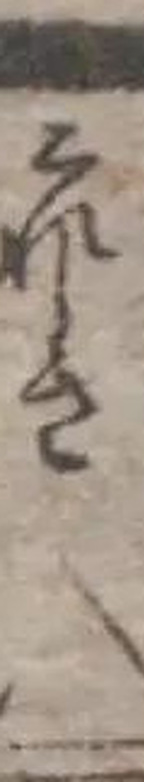これしき
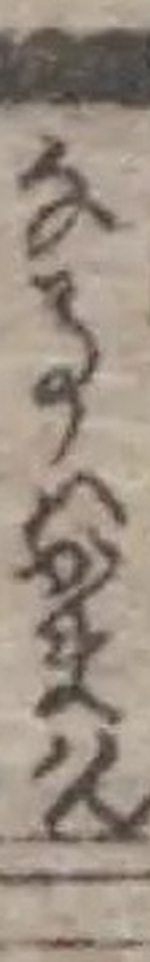な事はかまはん
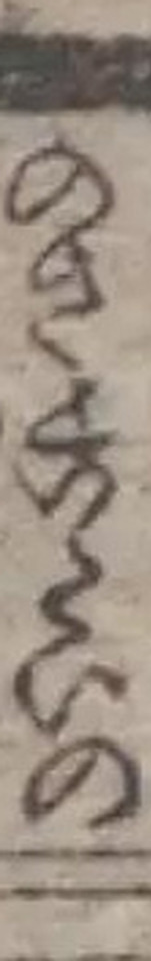のさといたいの
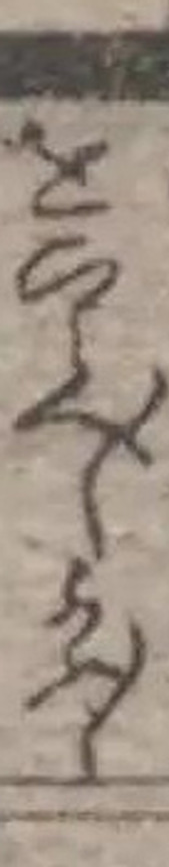をこらへ〳〵よふ〳〵
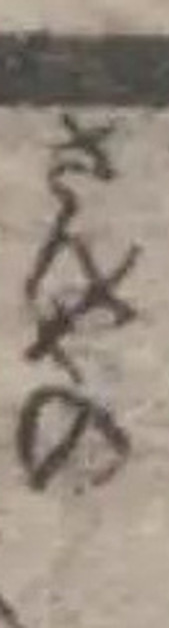さんやの
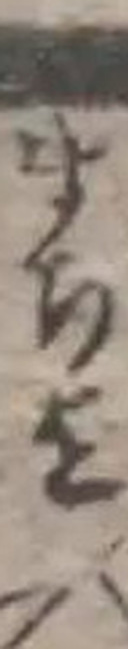まちを
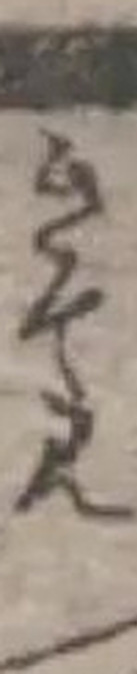きて見
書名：早出来 3巻
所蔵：国立国会図書館 National Diet Library, JAPAN
